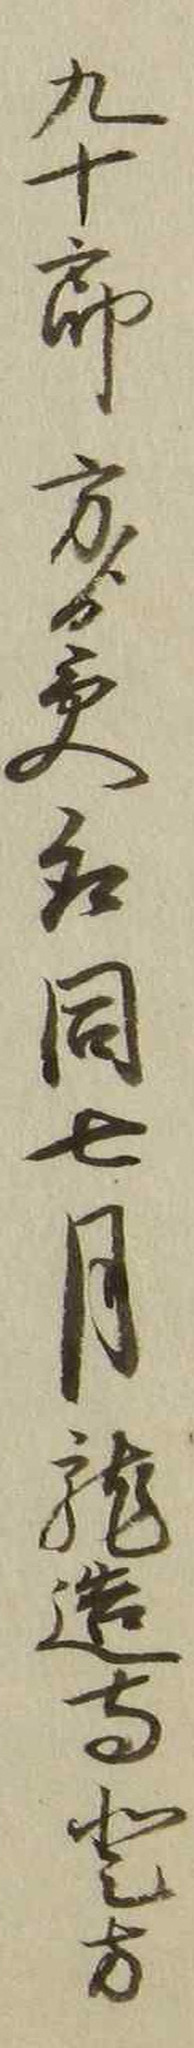九十郎方ゟ受取同七月竜造寺登方
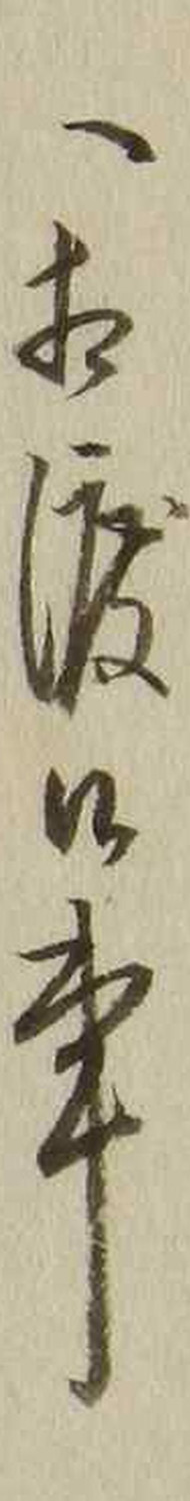へ相渡候事
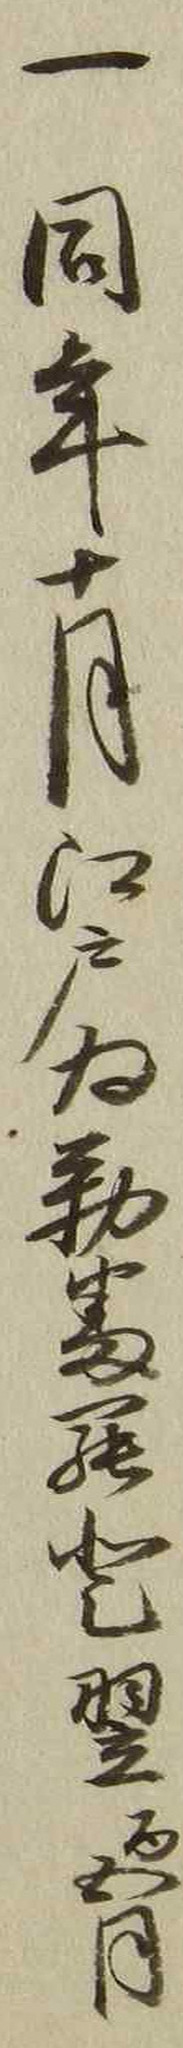一同年十月江戸為勤番罷登翌酉五月
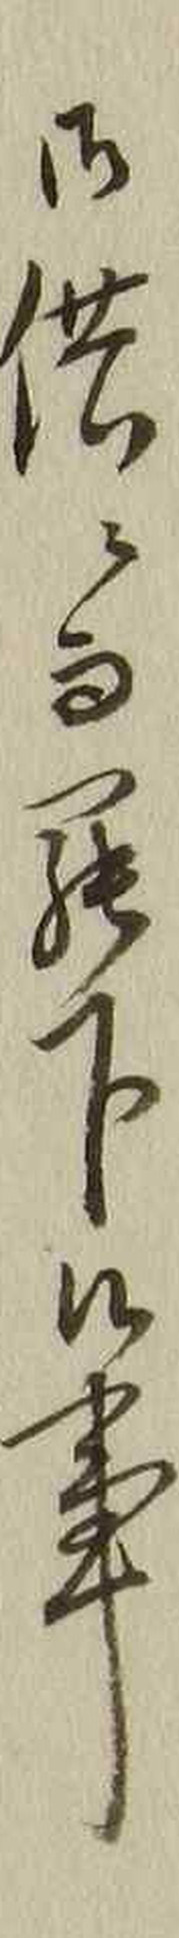御供に而罷下候事
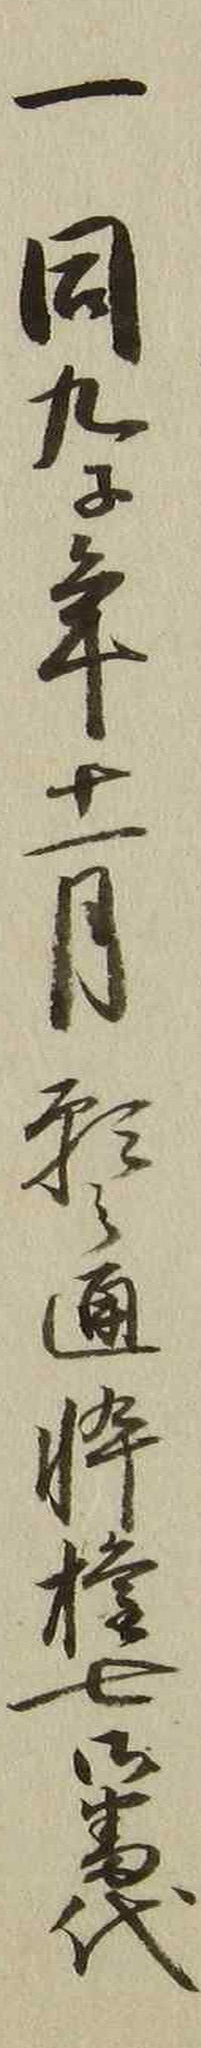一同九子年十一月願之通忰権七御番代
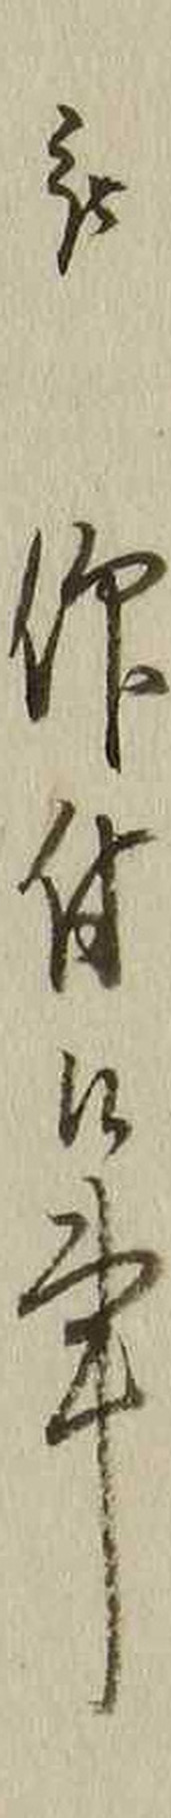被仰付候事
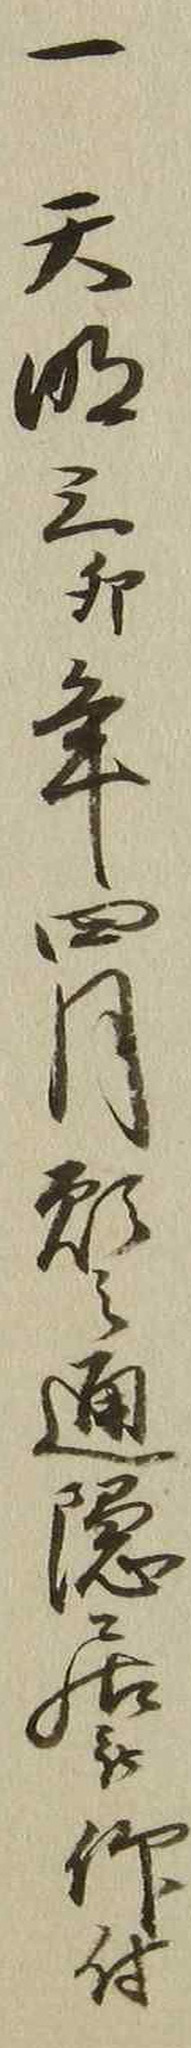一天明三卯年四月願之通隠居被仰付
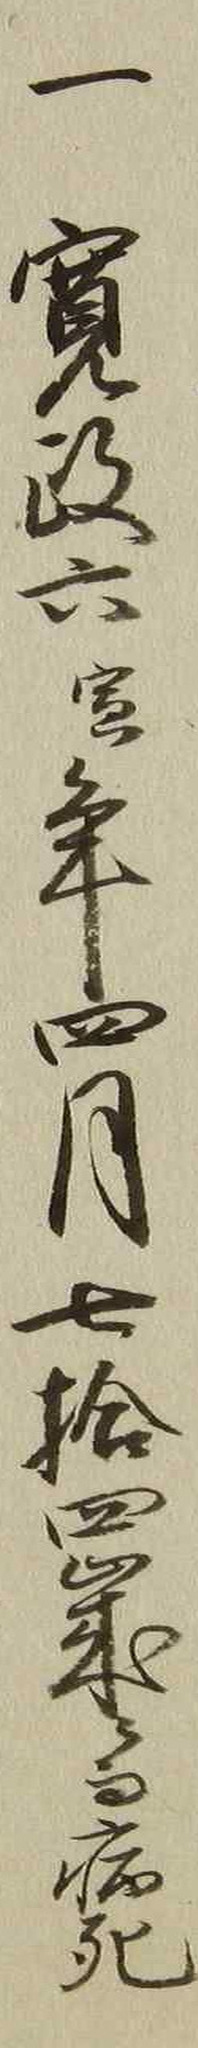一寛政六寅年四月七拾四歳に而病死
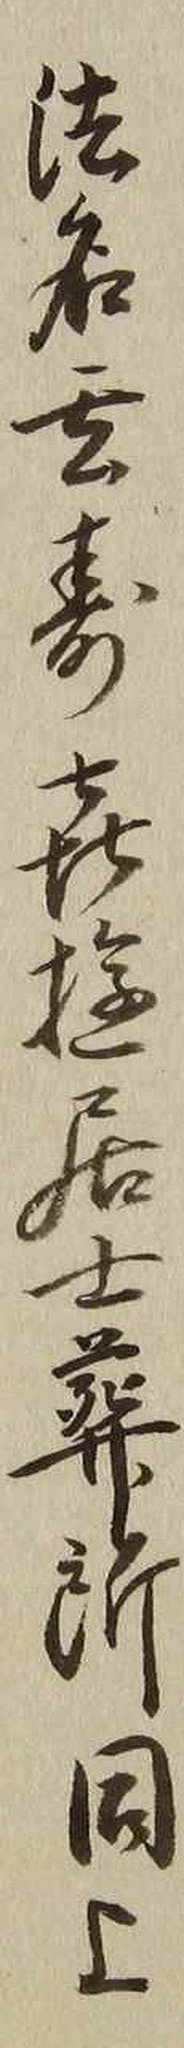法名玄寿喜遊居士葬所同上
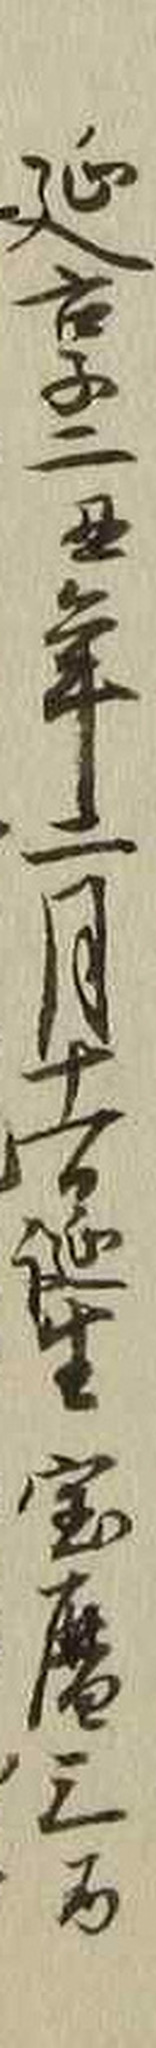延享二丑年二月十一日誕生宝暦三酉
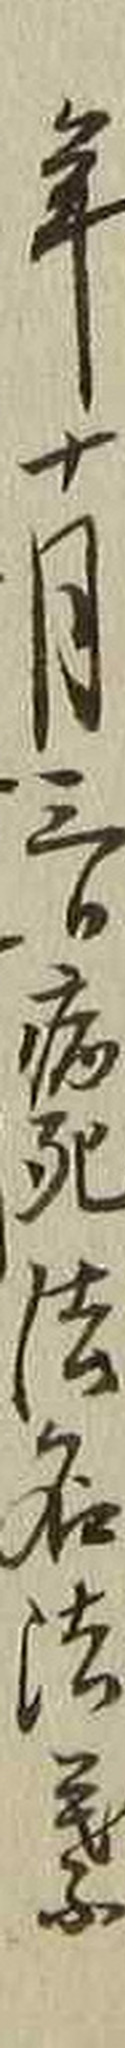女年十月三日病死法名葉
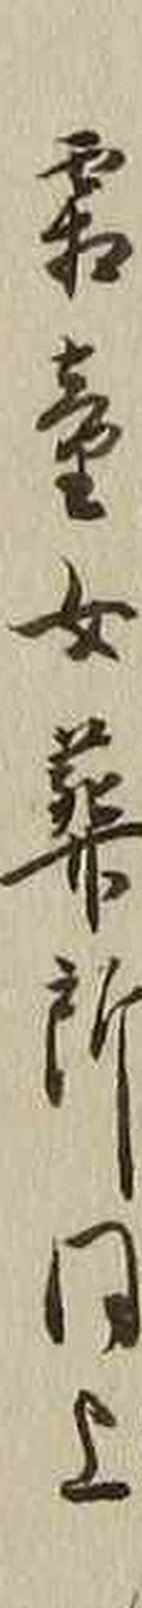霜童女葬所同上
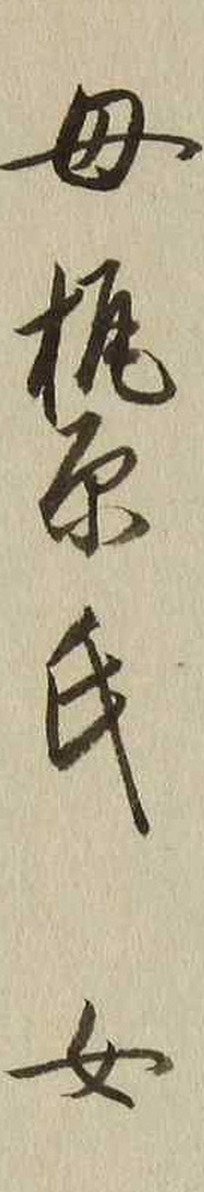母梶原氏女
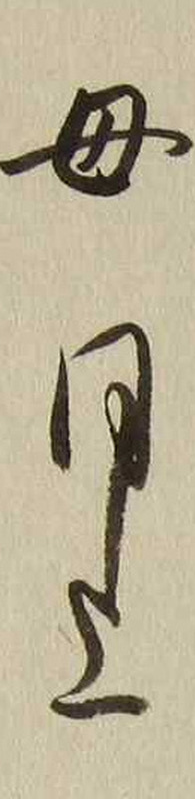母同上
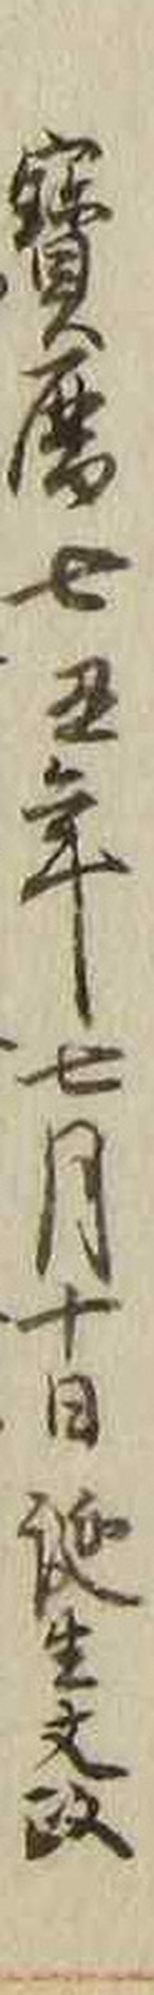宝暦七丑年七月十日誕生文政
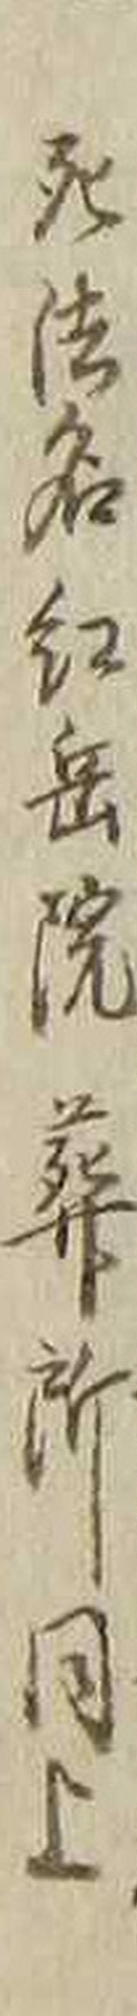死法名紅岳院葬所同上
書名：諸士系譜　巻之133　た之部9
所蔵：会津若松市立会津図書館
